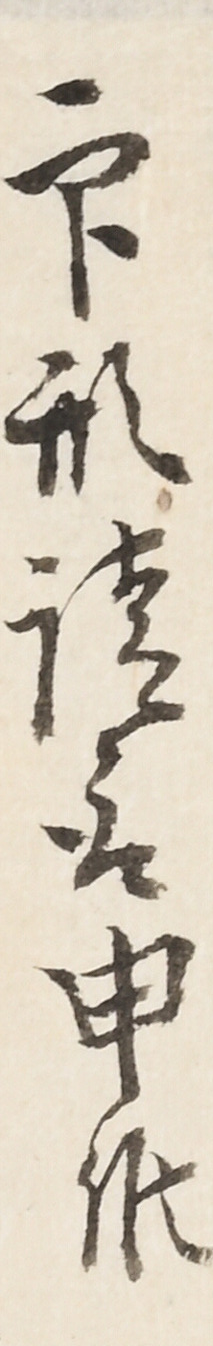印形請取申候
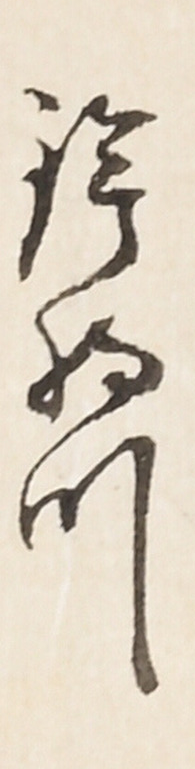鉾持町
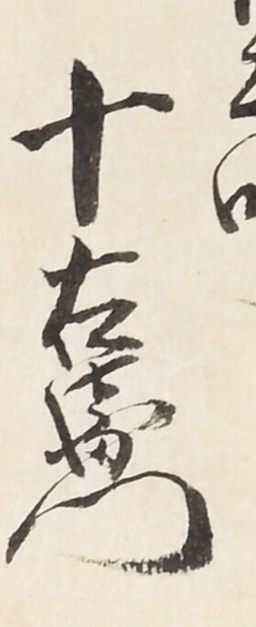十右衛門
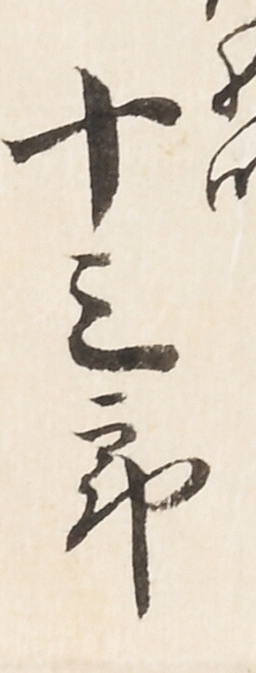十三郎

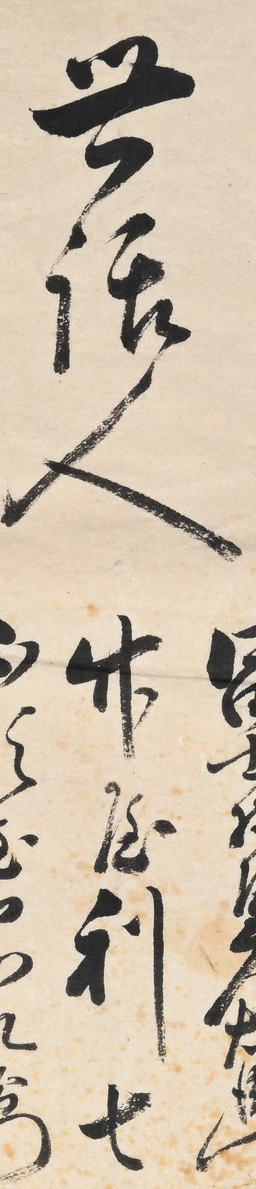世話人升屋利七
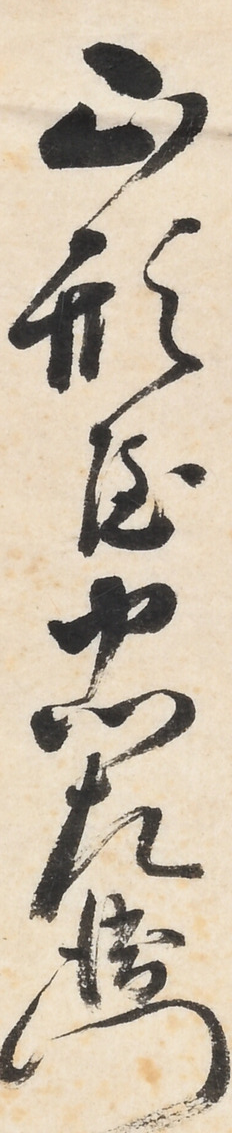山形屋忠左衛門
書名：信友講勘定簿
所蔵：伊那市立高遠町図書館・合同会社AMANE
